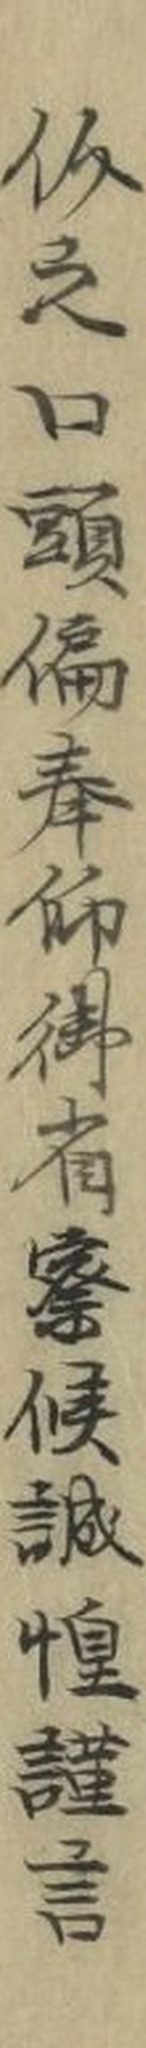价之口頭偏奉抑御省察候誠惶謹言
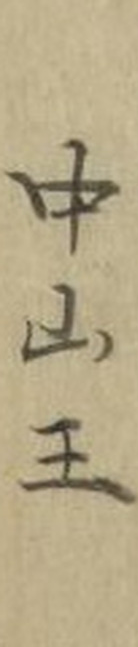中山王
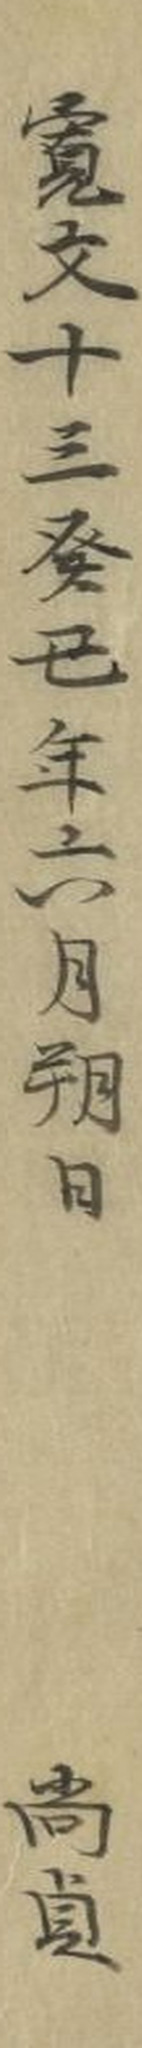寛文十三年癸丑年六月朔日尚貞
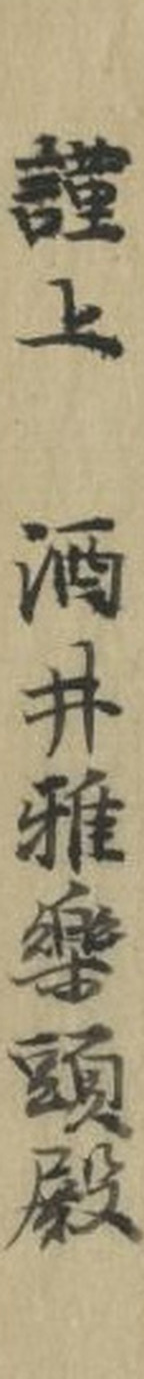謹上酒井雅楽頭殿
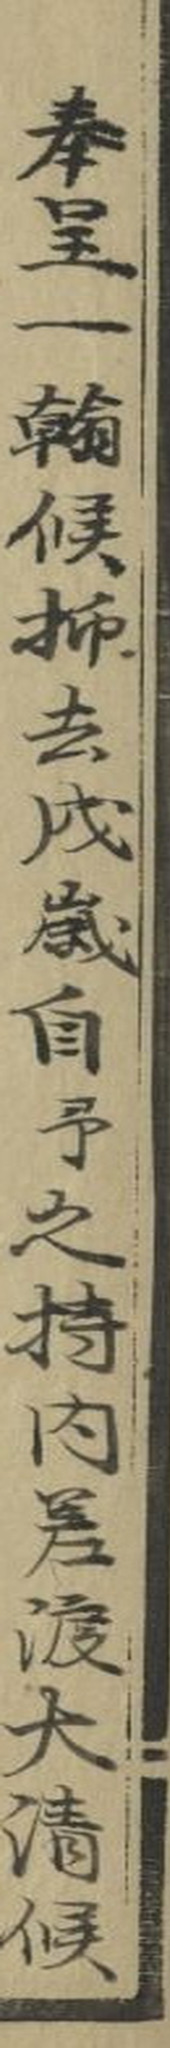奉呈一翰候抑去戌歳自予之持内差渡大清候
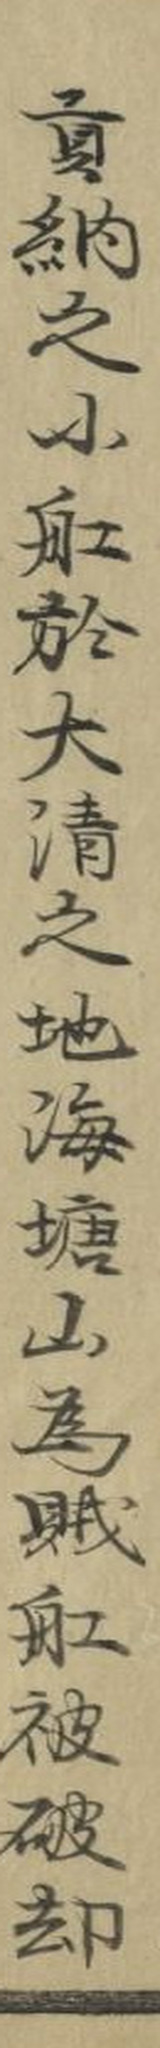貢納之小舩於大清之地海塘山為賊舩被破却
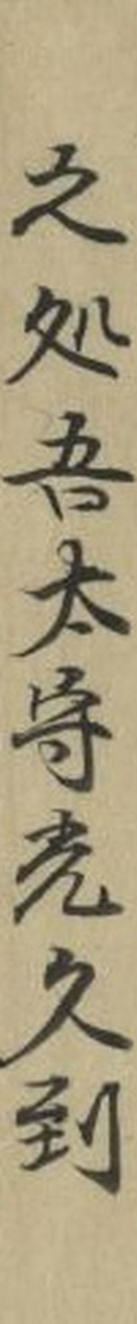之処吾太守光久到
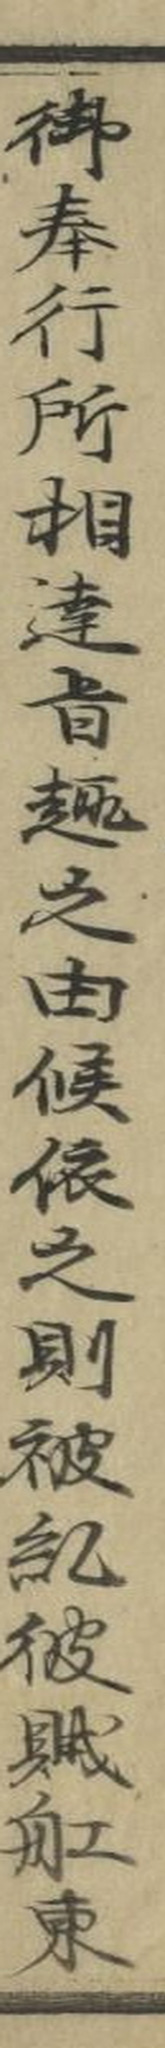御奉行所相達旨趣之由候依之則被糺彼賊舩東
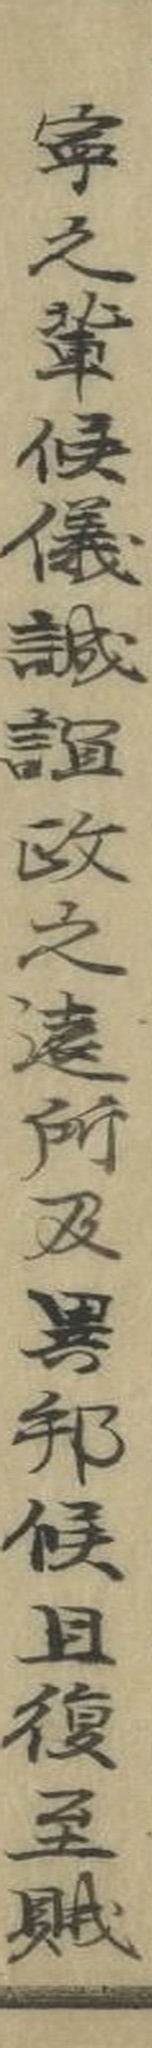寧之輩候儀誠誼政之遠所及異邦候且復至賊
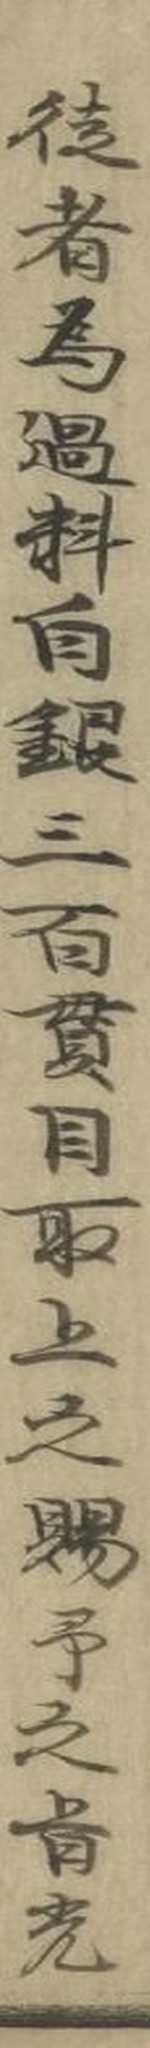従者為過料白銀三百貫目取上之賜予之旨光
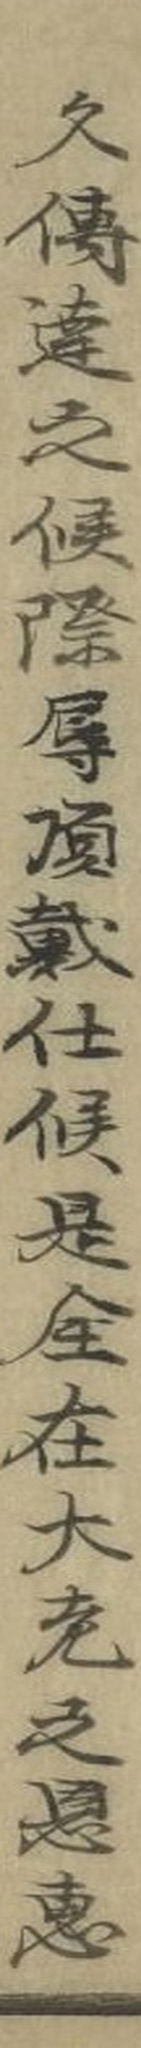久伝達之候際辱頂戴仕候是全在大老之恩恵
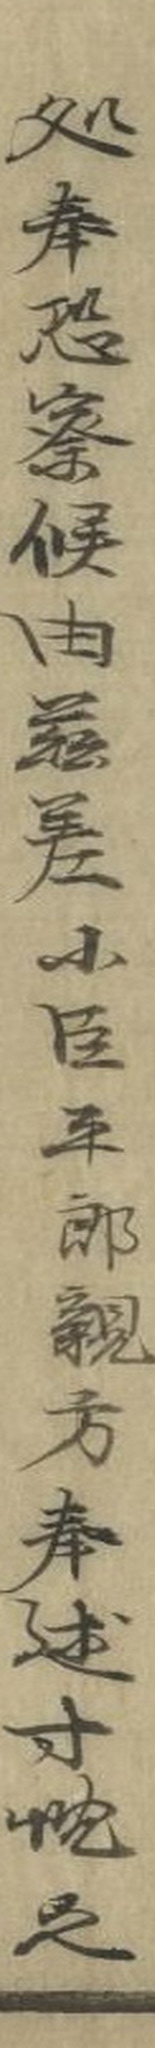処奉恐察候由茲差小臣平郎親方奉述寸忱之
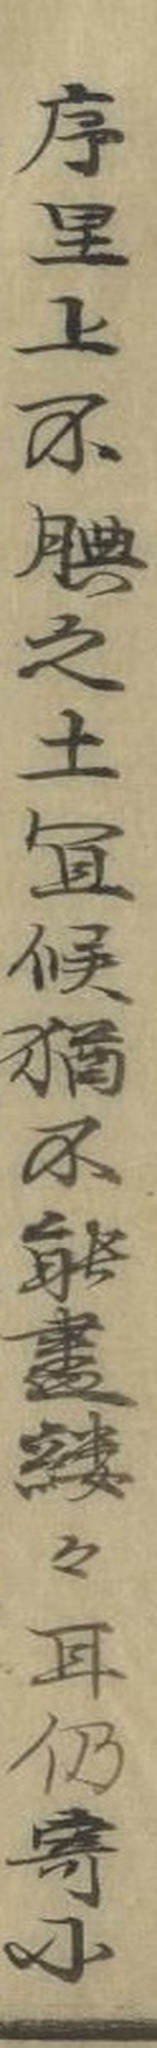序進献不腆之土冝候猶不能尽縷々耳仍寄小
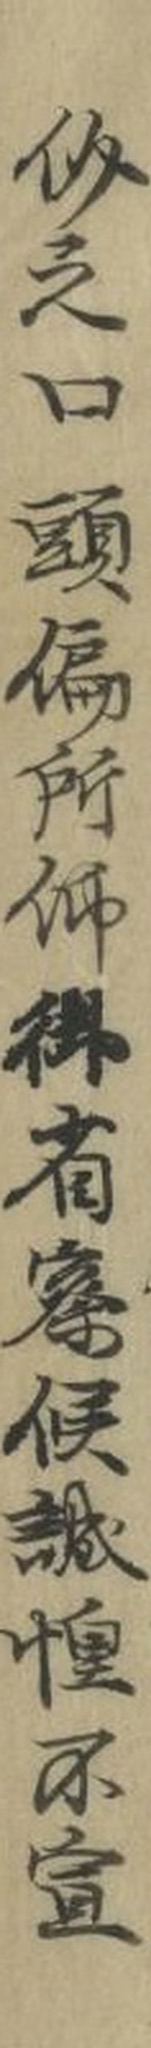价之口頭偏所抑御省察候誠惶不宣

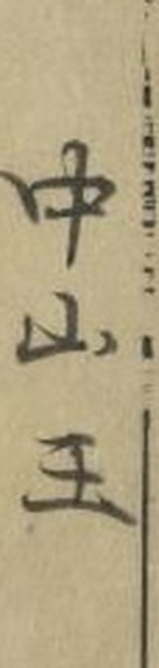中山王
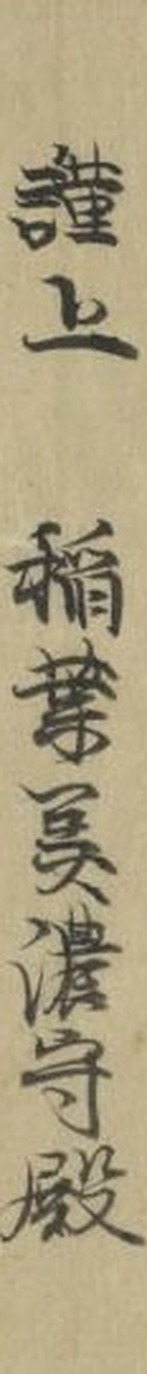謹上稲葉美濃守殿
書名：琉球往来（下）
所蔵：University of the Ryukyus Library
